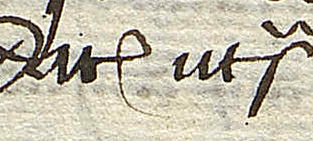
Dat* ut ſ*
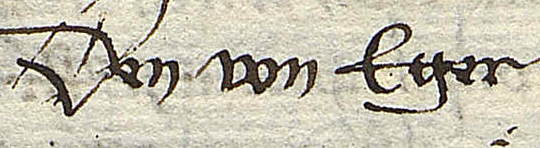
Den von Eger
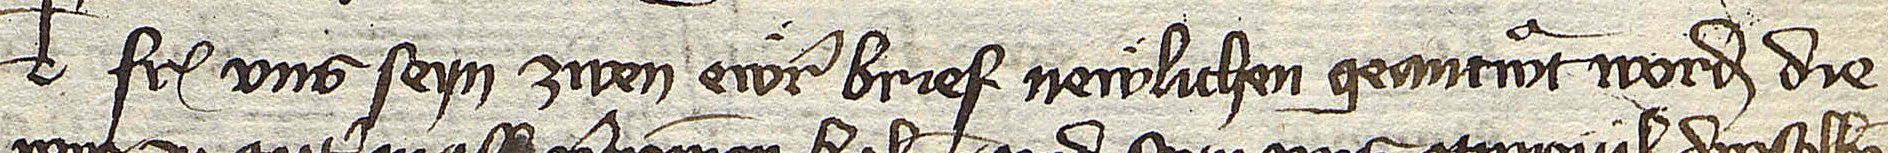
L* fr* vns ſeyn ʒwen eẅr* brief neẅlichen geantwt* word* die
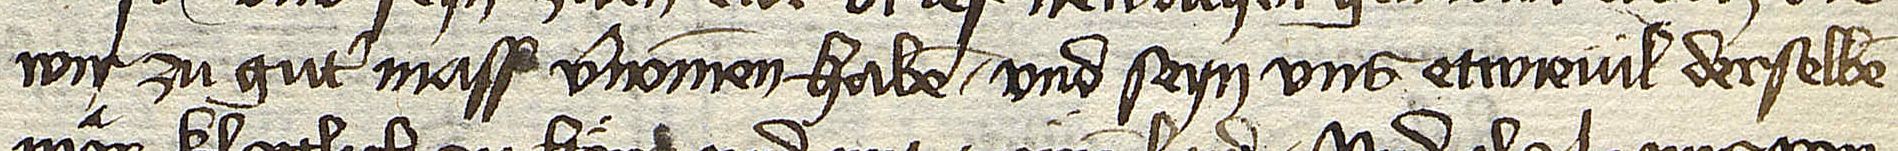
wir ʒu gut* maſſ* v*nomen habe* / vnd ſeyn vns etwieuil derſelbe*
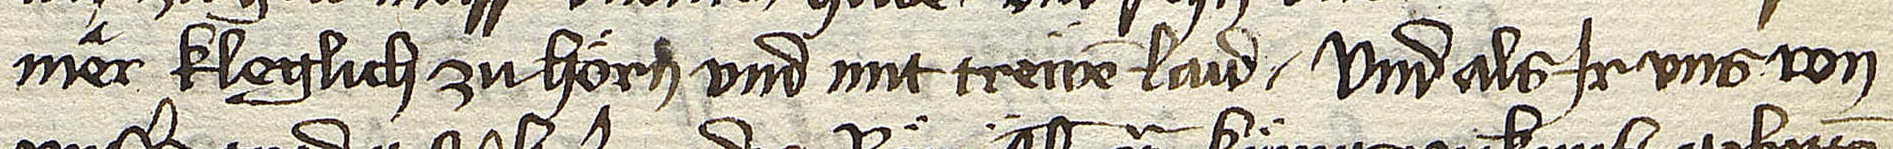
mër kleglich ʒu hörn vnd mit treẅe* laid / Vnd als Ir vns von
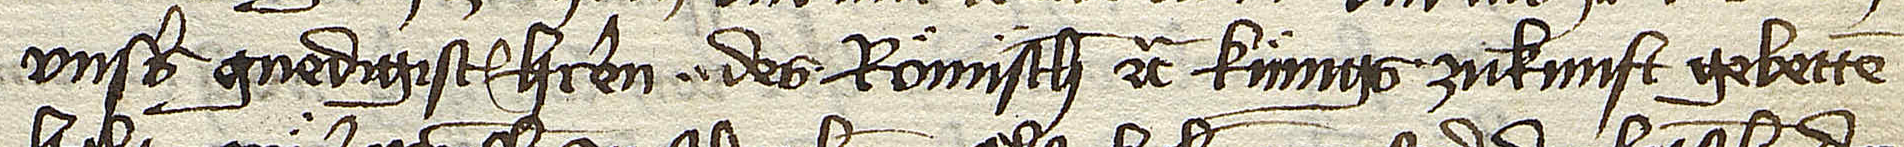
vnſs* gnedigiſt* hr*en ~ des Römiſch* ec* künigs ʒukunft gebette*
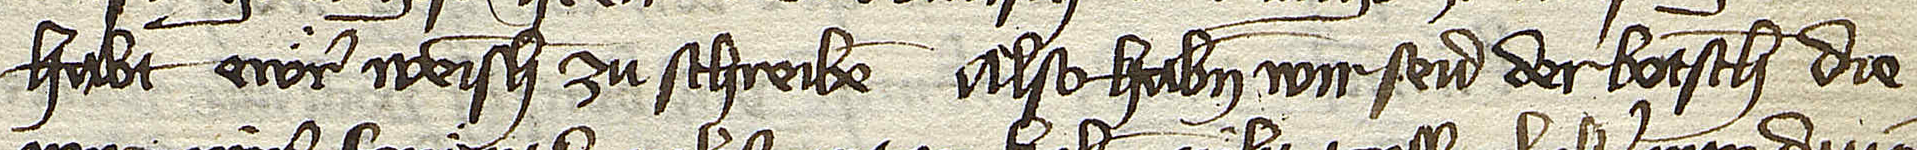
habt eẅr* weiſh* cʒu ſchreibe* Alſo habn* wir ſeid der botſch* die
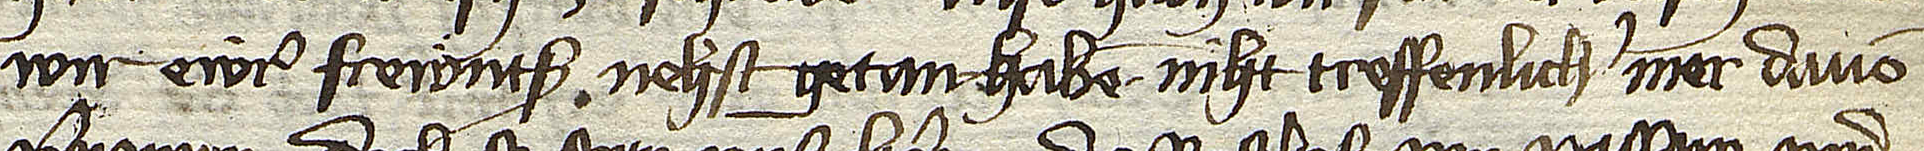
wir eẅr* freẅntſ* nehſt getan habe* . niht treffenlich* mer dauo*
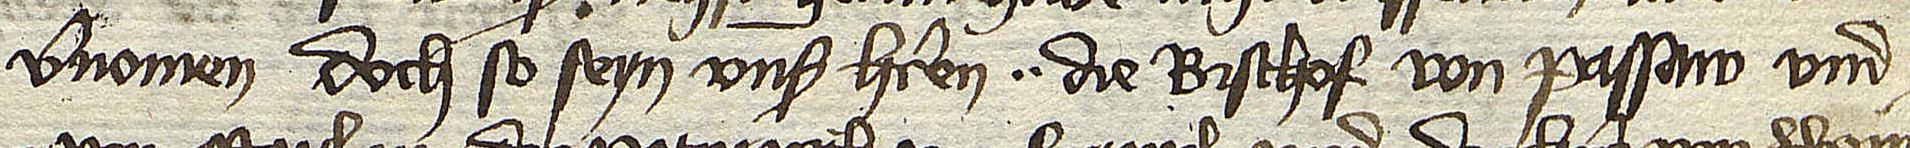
v*nomen Doch ſo ſeyn vnſ* hr*en ~ die Biſchof von Paſſaw vnd
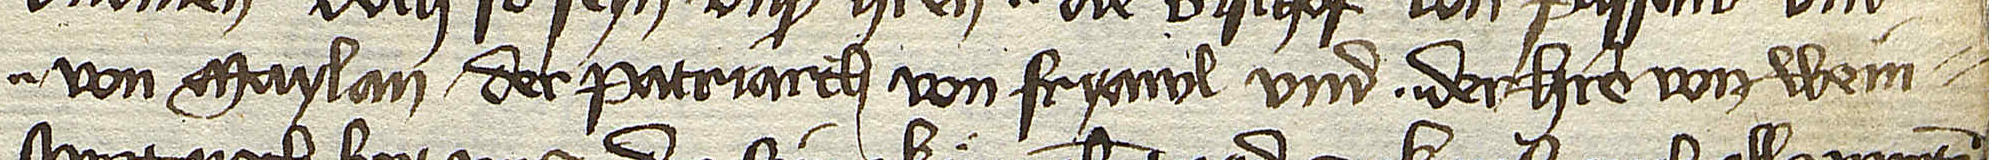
~ von Maylan / der Patriarch von fryawl vnd ~ der hr*e von wein =
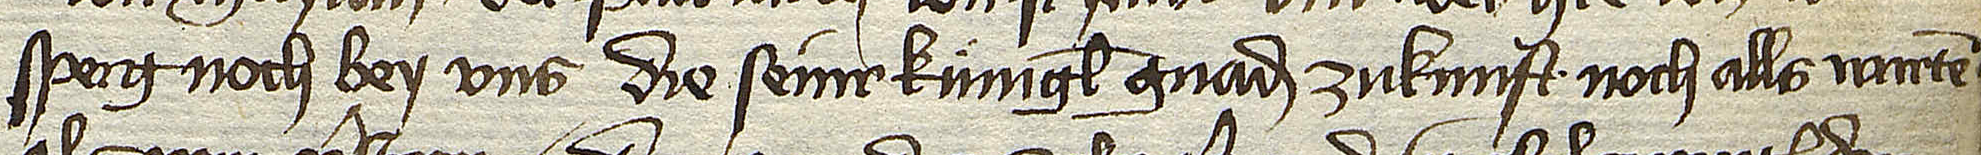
ſperg noch bey vns die ſeinr* küngl* gnad* ʒukunft noch alls warte*
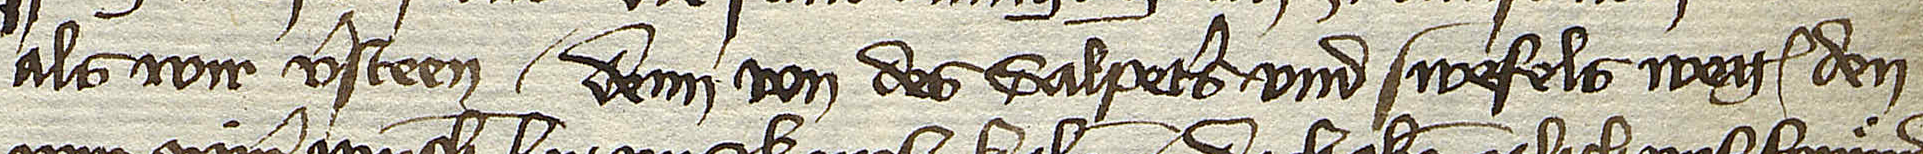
als wir v*ſteen / Denn von des Salpeter*s vnd ſwefels weg* den
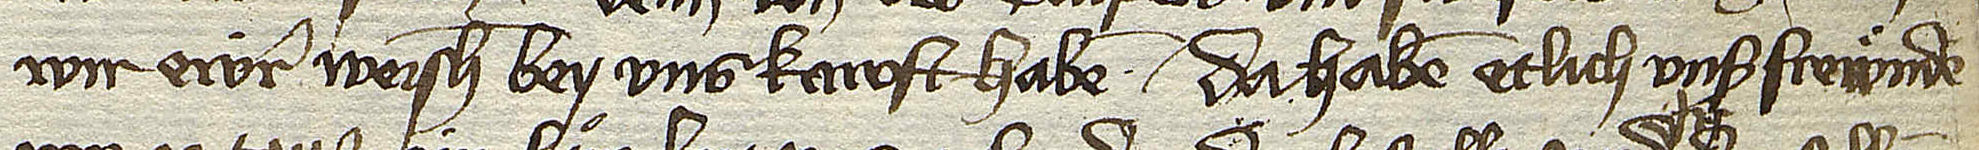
wir eẅr* weiſh* bey vns kawft habe* / Da habe* etlich vnſ* freẅnde
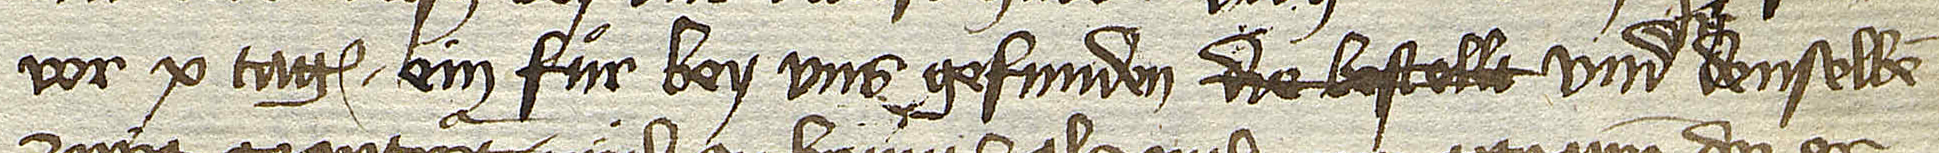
vor x tag* / ein für bey vns gefunden die beſtellt vnd denſelbe*
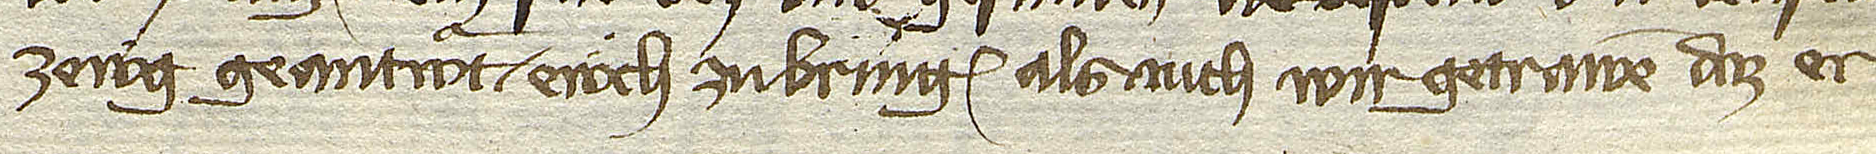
ʒeẅg geantwt* / eẅch ʒubring* als auch wir getrawe* daʒ er
